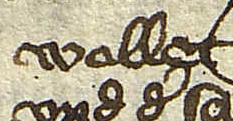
wollet /
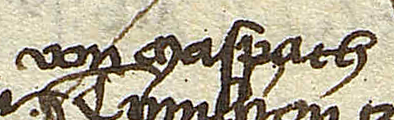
von Maſpach
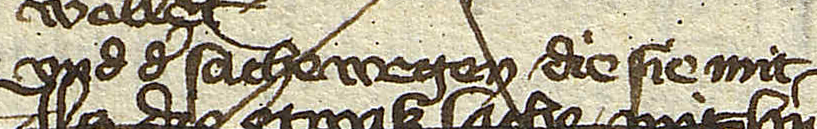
vnd d* ſache wegen / die ſie mit
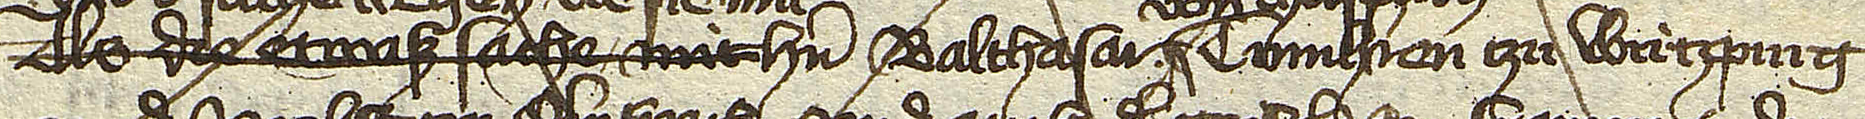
Als die etwaſʒ ſache / mit hn* Balthaſar . Tumh*ren cʒu wircʒpurg
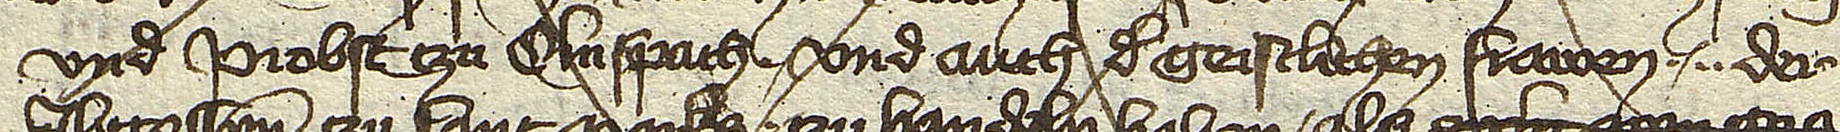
vnd Probſt cʒu Olnſpach . vnd auch d* geiſtlichen frawen . / ~ der
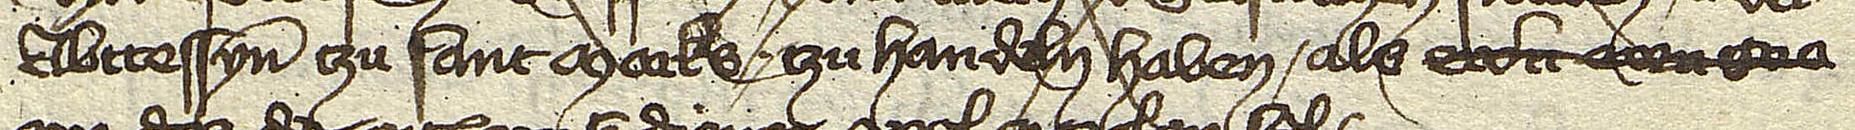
Abtteſſyn cʒu ſant Marks . cʒu handeln haben / als ew*n ewn gna
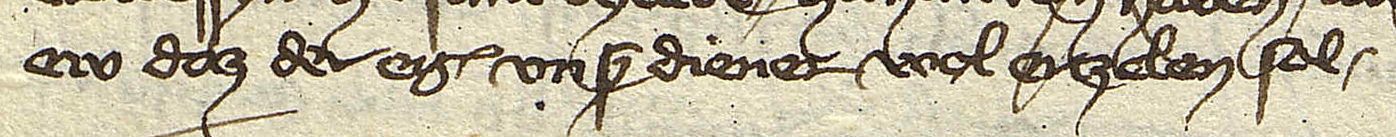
ew daʒ der eg* vnſ* diener wol ercʒelen ſol /
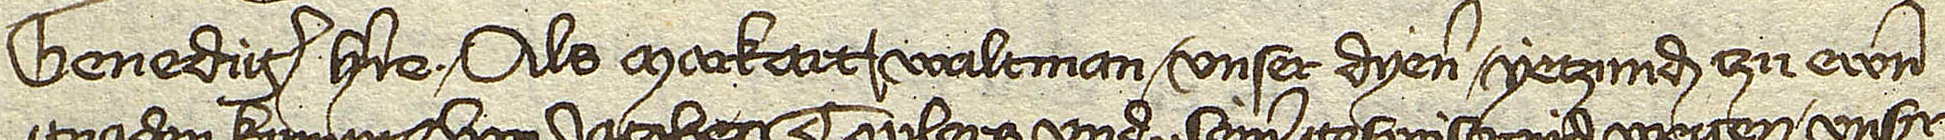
Gnedig* h*re . / Als Markart waltman / vnſer dyen* yecʒund* cʒu ewn*
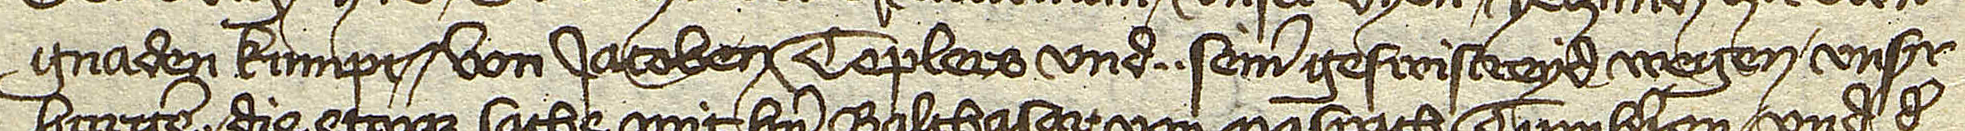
gnaden kumpt / von Iacoben Teplers vnd ~ ſein* geſwiſtreyd wegen / vnſ*r
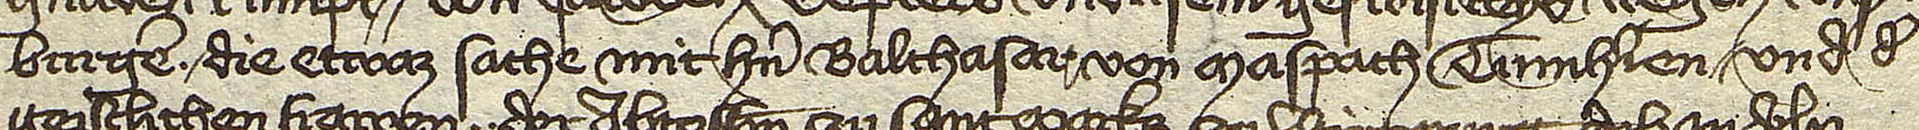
burge* . / die etwaʒ ſache mit hn* Balthaſar von Maʒpach Tumh*ren / vnd d*
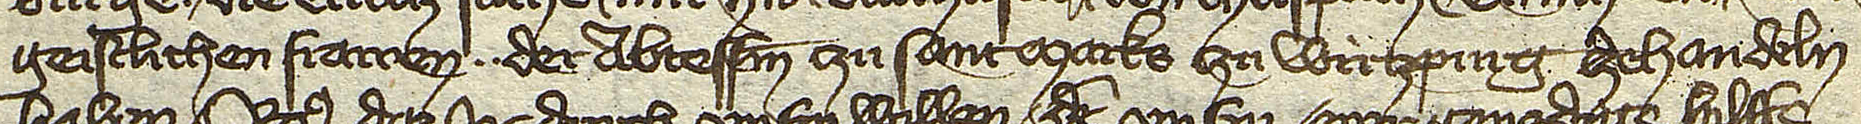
geiſtlichen frawen ~ der Abteſſin cʒu ſant Marks cʒu wircʒpurg cʒehandeln
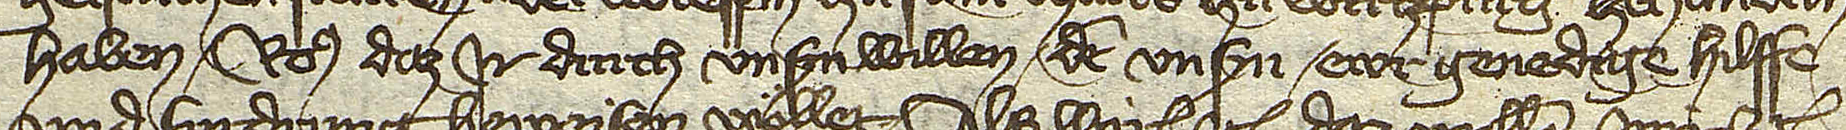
haben / Ro* daʒ Ir durch vnſ*n willen / d* vnſ*n / ewr gnedige hilffe
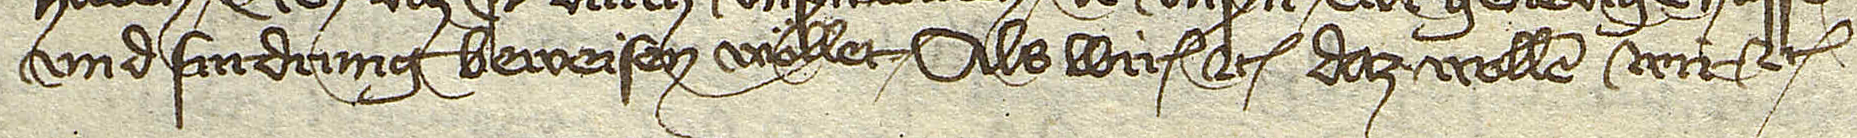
vnd furdrung beweiſen wöllet . / Als wir* ec* daʒ wolle* wir* ec*
